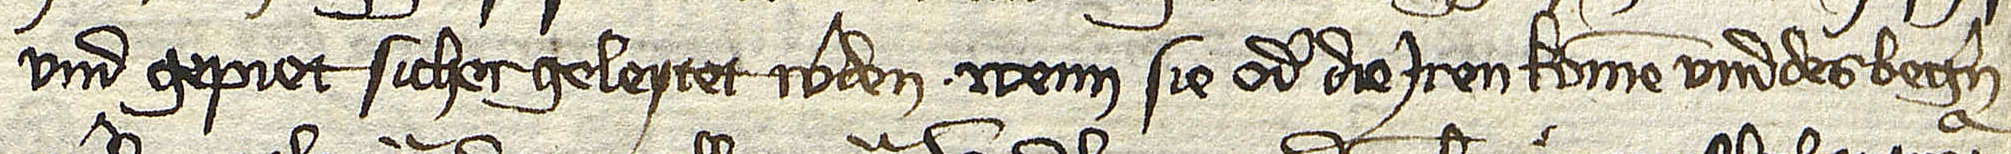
vnd gepiet ſicher geleytet w*den . wenn ſie od* die Iren kome* vnd des beg*n
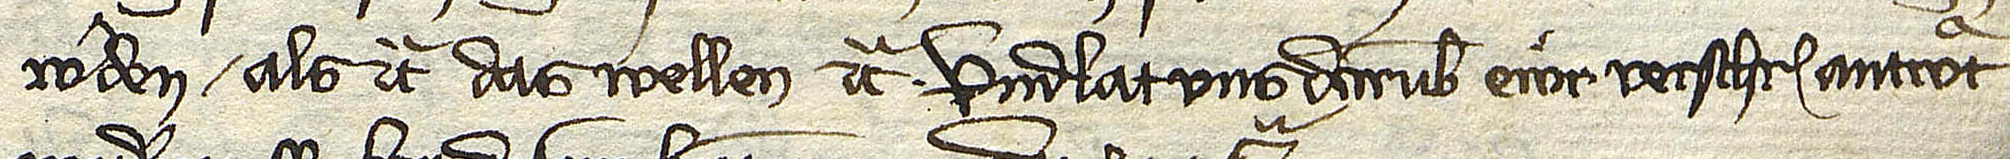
w*den / als ec* das wellen ec* . Vnd lat vns daru*b ewr verſchr* antw*t
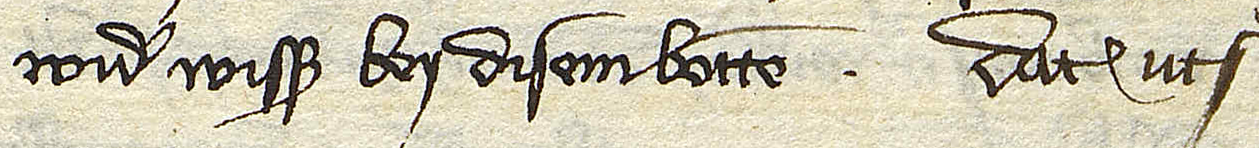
wid* wiſſ* bey diſem botte* . Dat* ut ſ*
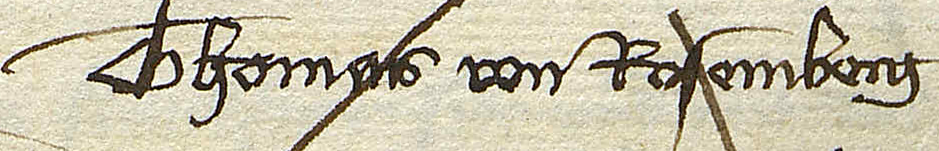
Thomas von Roſemberg
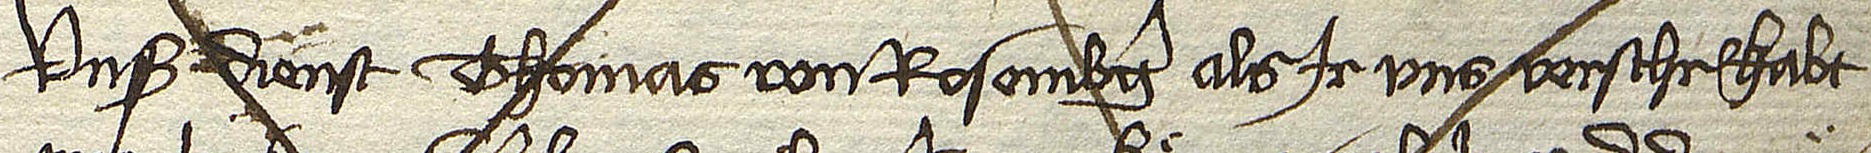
Vnſ* dienſt Thomas von Roſemb*g als Ir vns verſchr* habt /
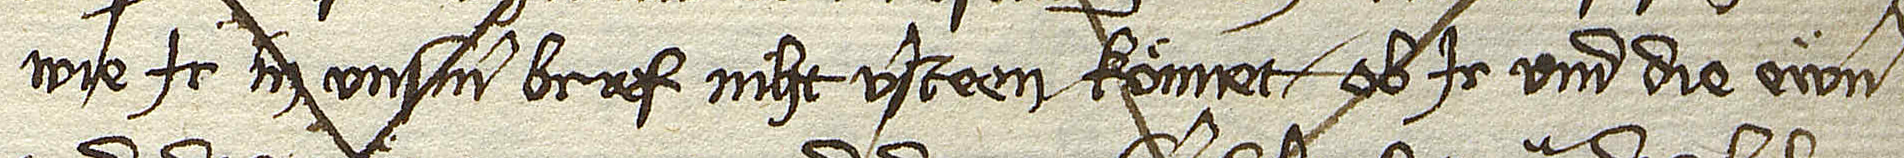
wie Ir in vnſ*m brief niht v*ſteen könnet / ob Ir vnd die ew*n
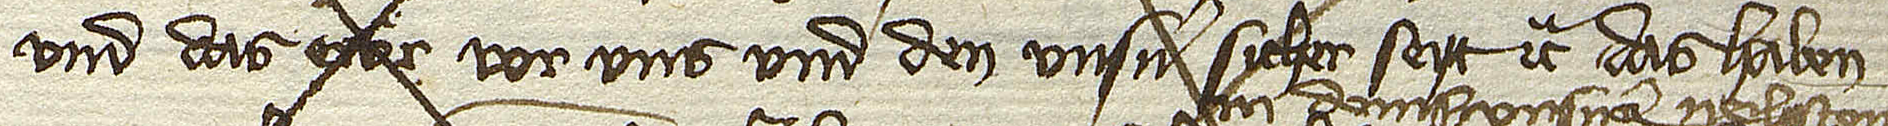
vnd das ewr vor vns vnd den vnſ*n ſicher seyt ec* / das haben
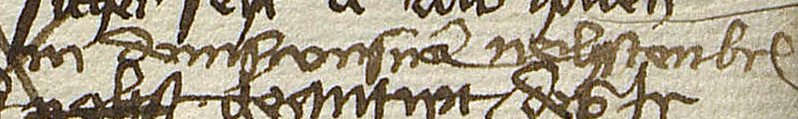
in demſ* vnſ*m nehſten br*
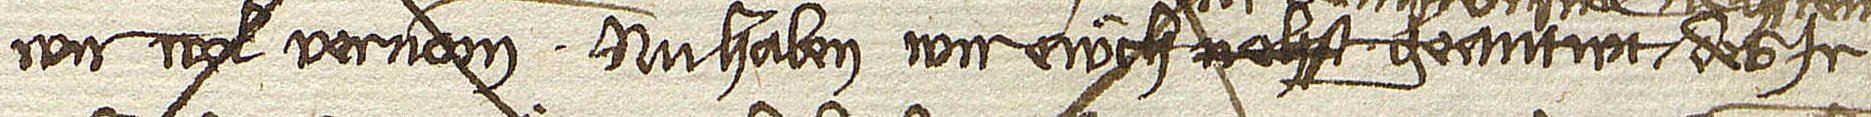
wir wol vernom* . Nu haben wir ewch nehſt geantw*t / des Ir
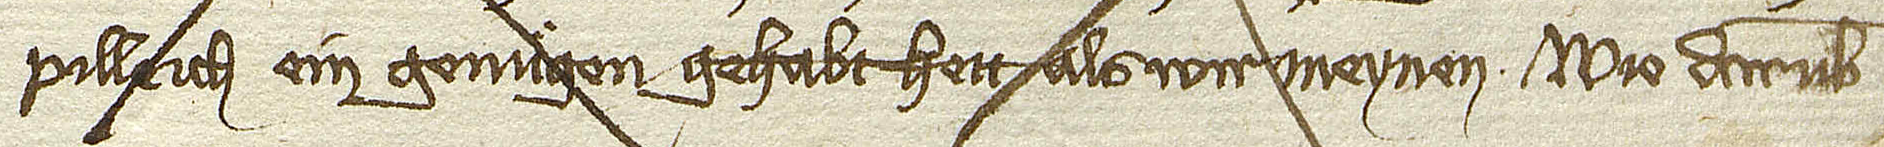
pilleich ein genügen gehabt hett als wir meynen . Wie daru*b
